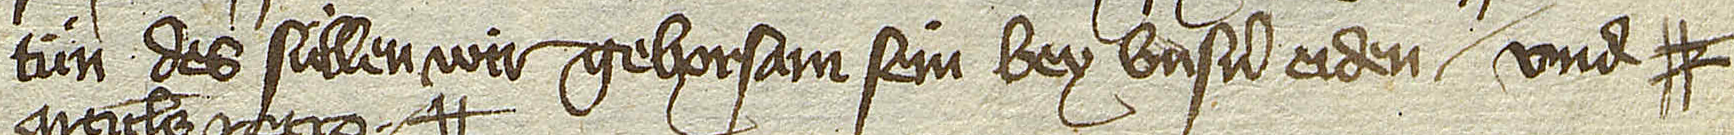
tün des ſüllen wir gehorſam ſein bey vnſn* eiden / vnd
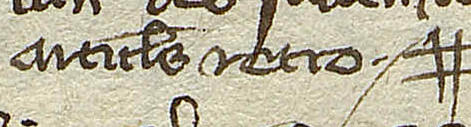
artuls* retro. /
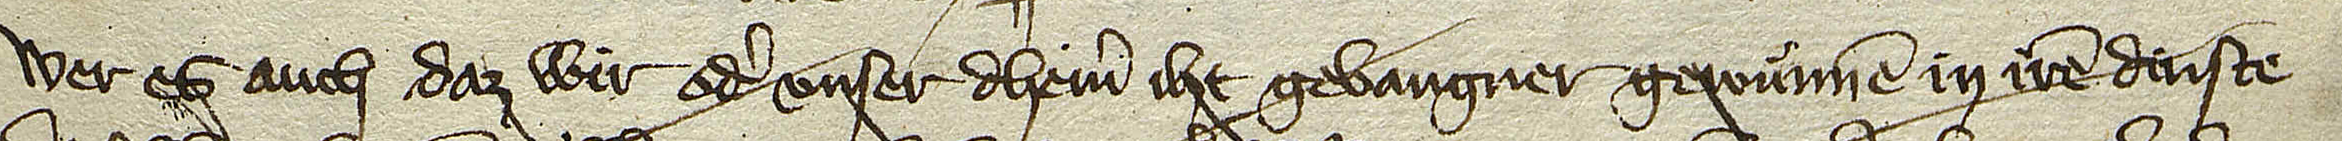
wer es auch auch / daʒ wir od* vnſer dhein* iht gevangner gewünne* in ire* dinſte
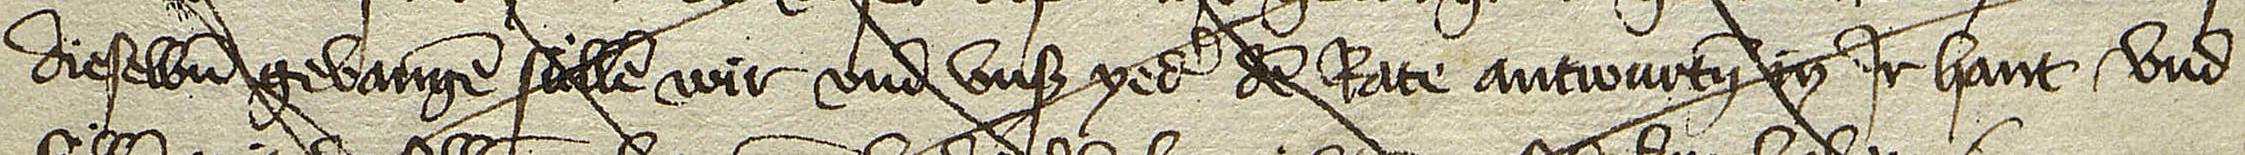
dieſelbn* gevange* ſülle* wir vnd vnſ* yed* de* Rate antwurtn* in Ir hant / vnd
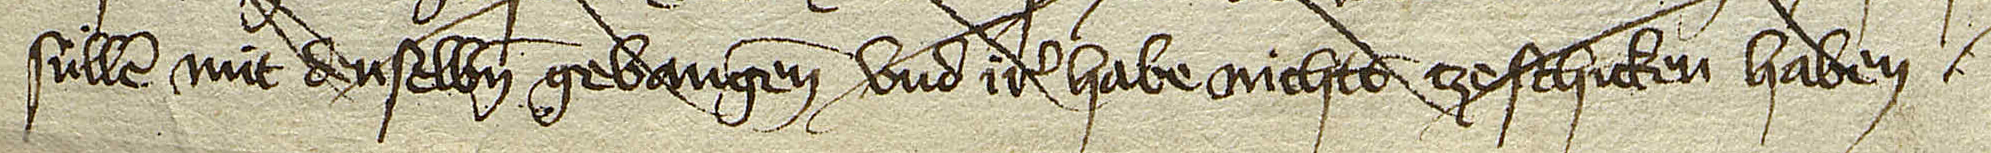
ſülle* Mit denſelbn* gevangen* vnd ir* habe nichts cʒeſchicken haben /
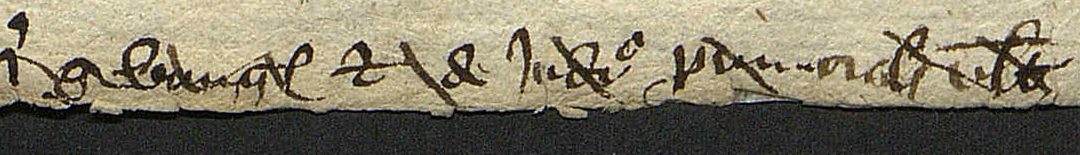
i gevang* @ de Iudi p*uinciali vlts*
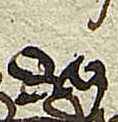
daʒ
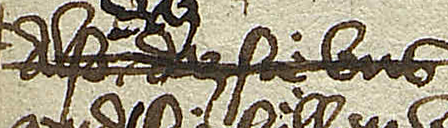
Alſo / daʒ ſie vns
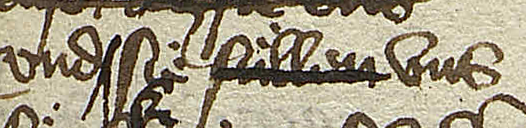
vnd ſie ſüllen vns
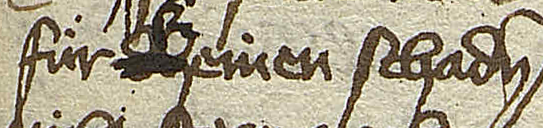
für dheinen ſchadn*
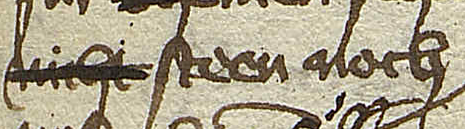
nicht ſteen noch
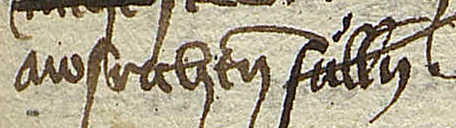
awſrichtn* ſülln* .
